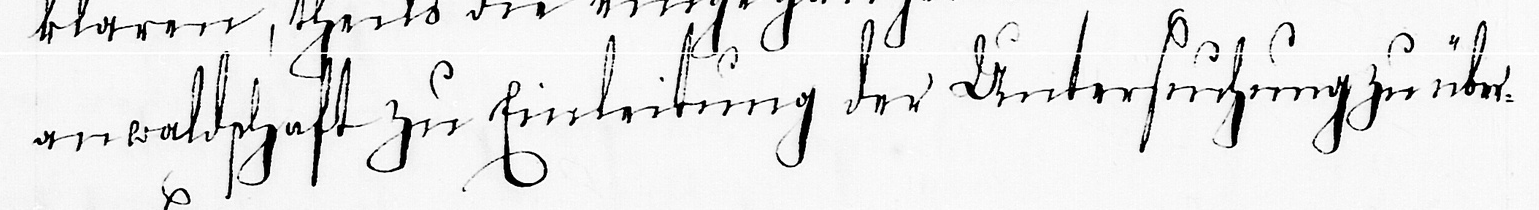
anwaldschaft zu Einleitung der Untersuchung zu über¬
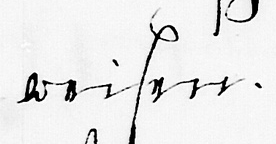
weisen.
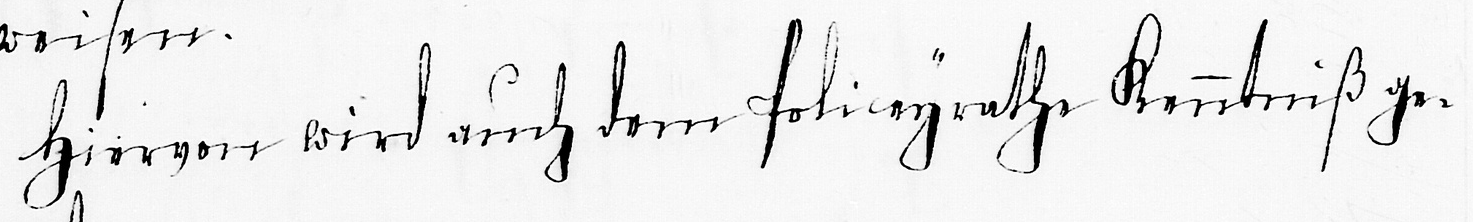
Hiervon wird auch dem Policeyrathe Kenntniß ge¬
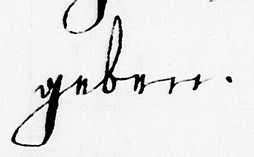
geben.
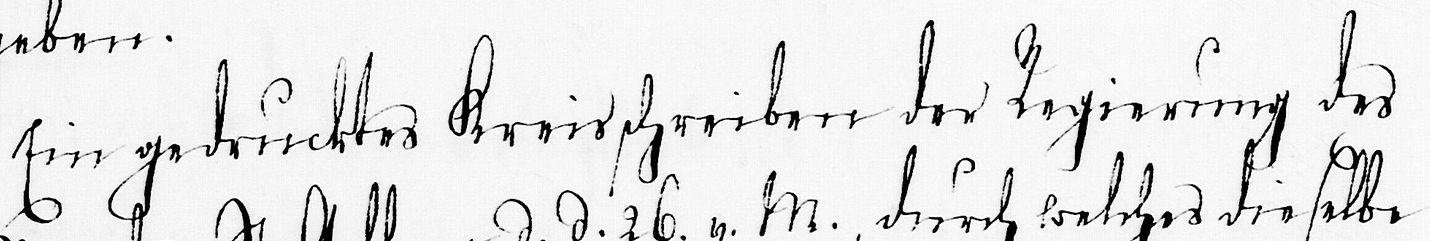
Ein gedrucktes Kreisschreiben der Regierung des
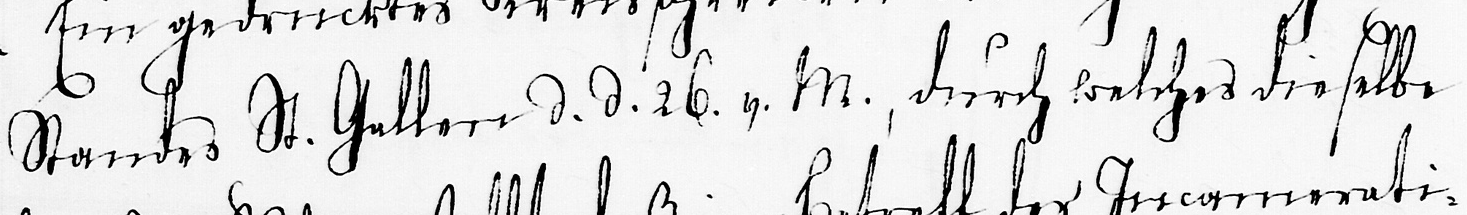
Standes St. Gallen d. d. 26. v. M., durch welches dieselbe
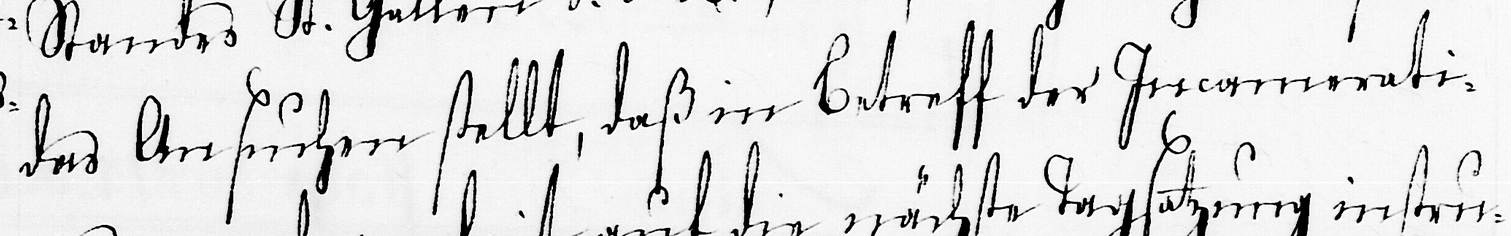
das Ansuchen stellt, daß in Betreff der Incamerati¬
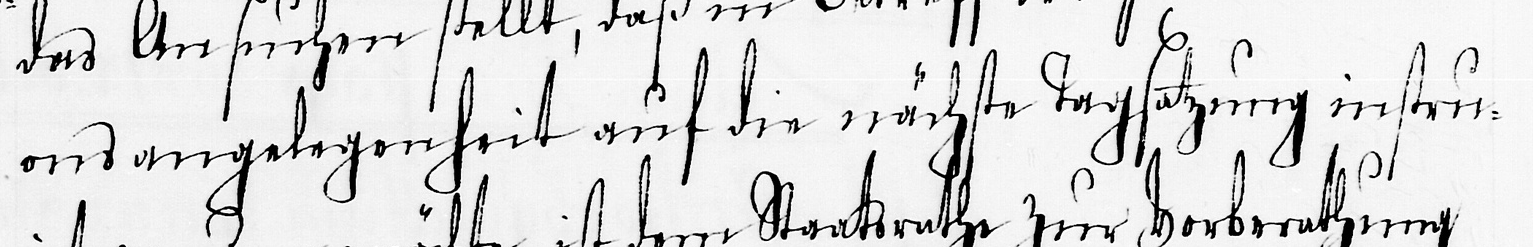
onsangelegenheit auf die nächste Tagsatzung instru¬
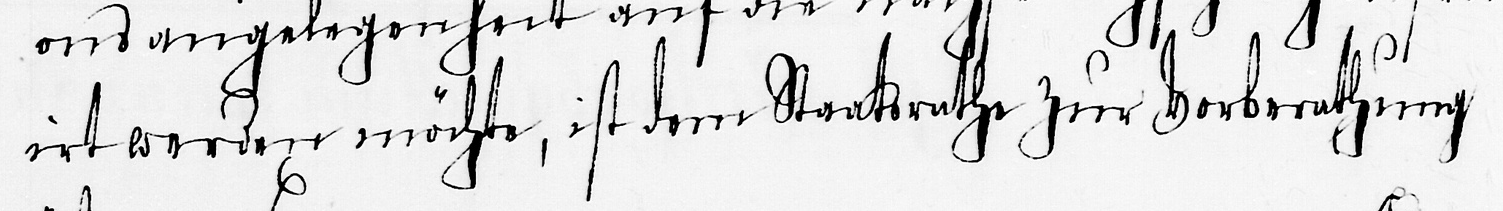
irt werden möchte, ist dem Staatsrathe zur Vorberathung
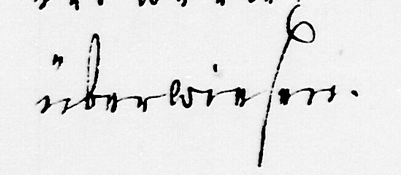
überwiesen.
